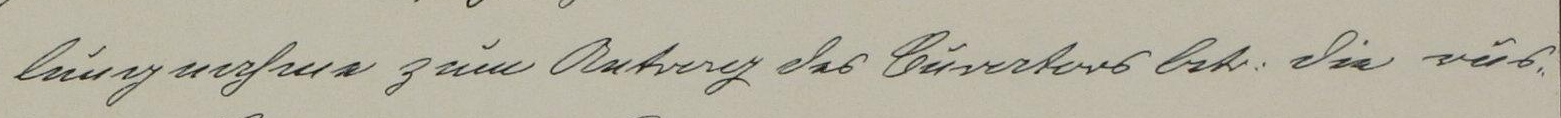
lungnahme zum Antrag des Curators betr. die rus-
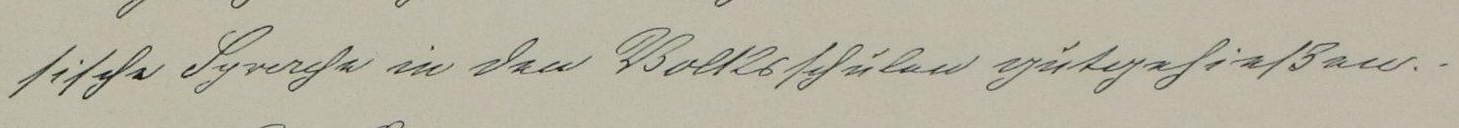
sische Sprache in den Volksschulen gutgehießen.
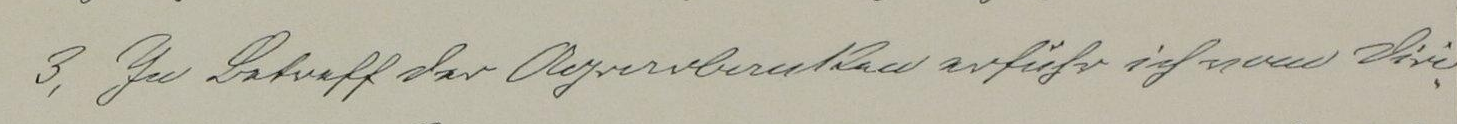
3. In Betreff der Agrarbanken erfuhr ich vom Diri-
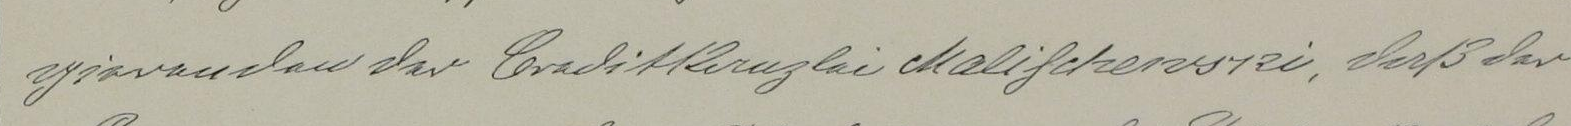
gierenden der Creditkanzlei Malischewski, daß der
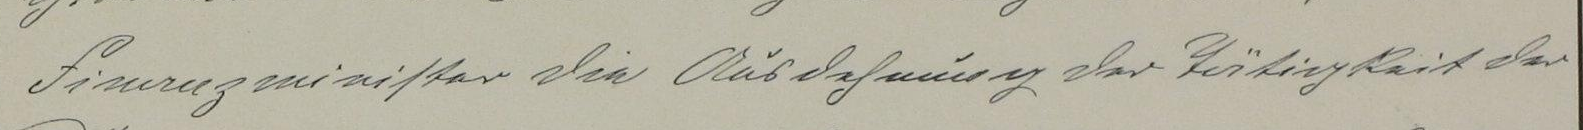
Finanzminister die Ausdehnung der Tätigkeit der
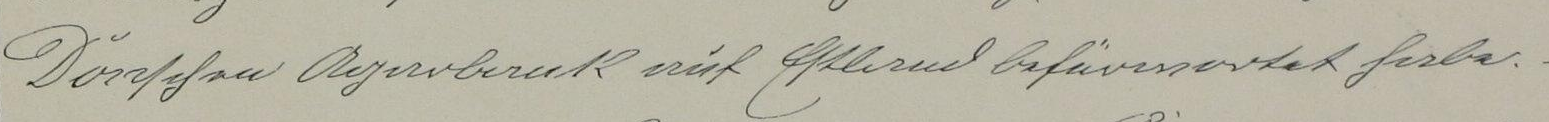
Donschen Agrarbank auf Estland befürwortet habe.
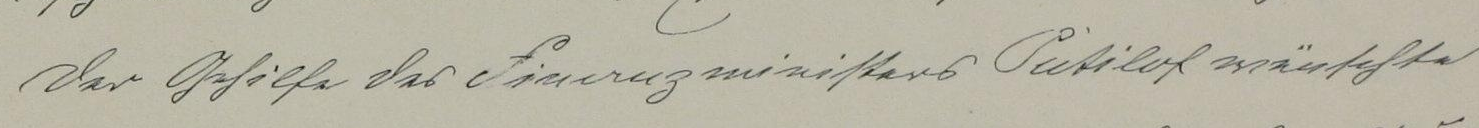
Der Gehilfe des Finanzministers Putilof wünschte
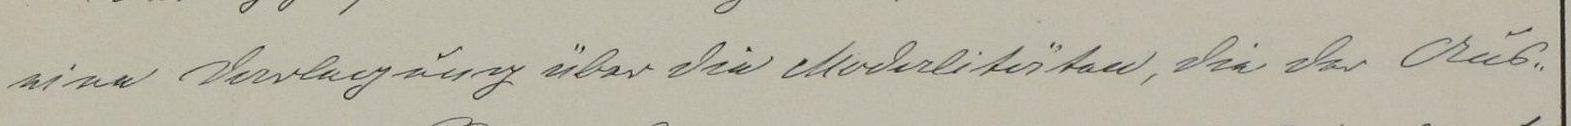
eine Darlegung über die Modalitäten, die der Aus-
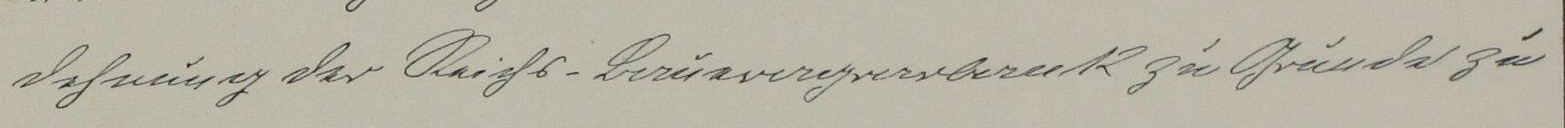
dehnung der Reichs-Baueragrarbank zu Grunde zu
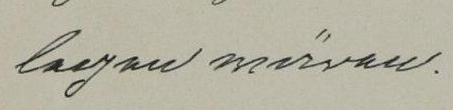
legen wären.
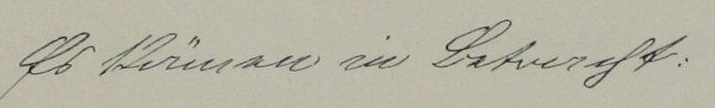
Es kämen in Betracht:
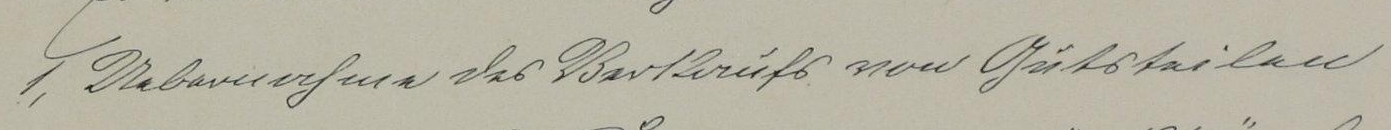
1. Uebernahme des Verkaufs von Gutsteilen
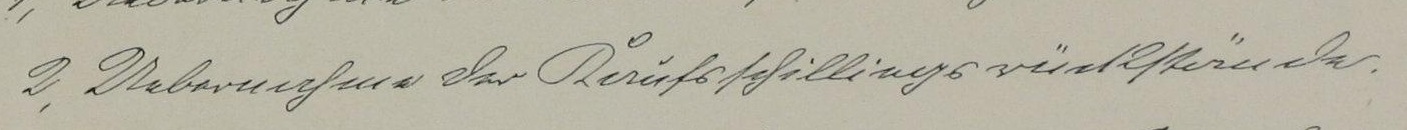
2. Uebernahme der Kaufsschillingsrückstände.
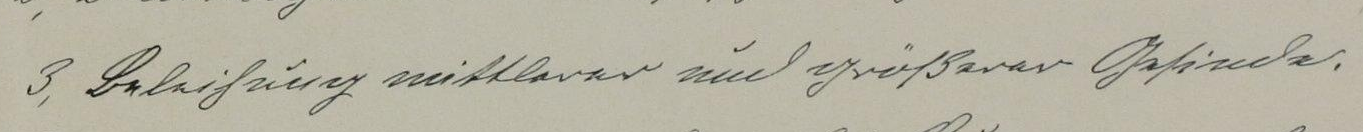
3. Beleihung mittlerer und größerer Gesinde.
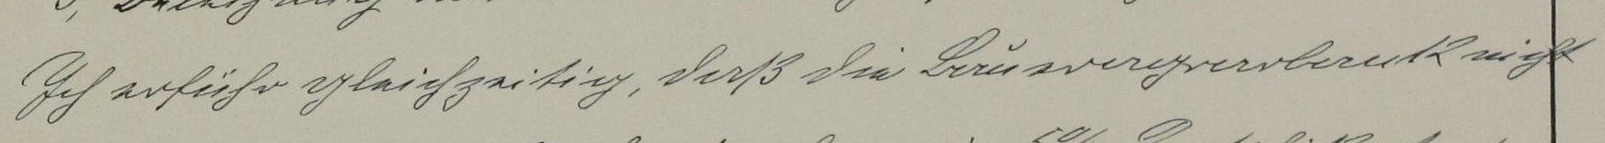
Ich erfuhr gleichzeitig, dass die Baueragrarbank nicht
